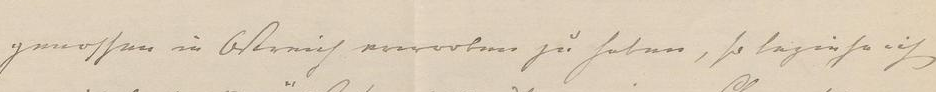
genossen in Östreich erworben zu haben, so beziehe ich
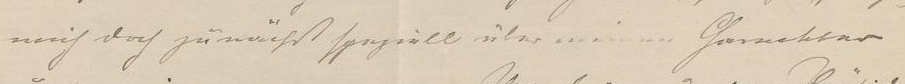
mich doch zunächst speziell über meinen Charakter
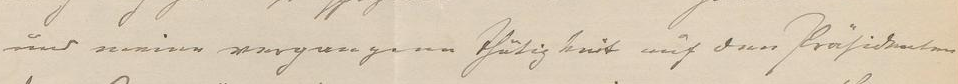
und meine vergangene Thätigkeit auf den Präsidenten
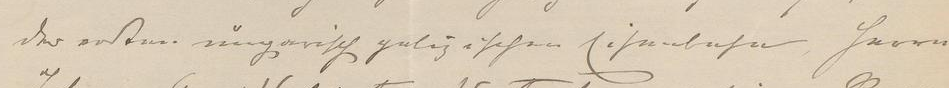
der ersten ungarischgalizischen Eisenbahn, Herrn
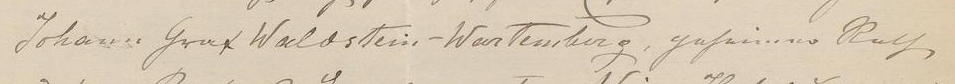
Johann Graf Waldstein-Wartemberg, geheimer Rath
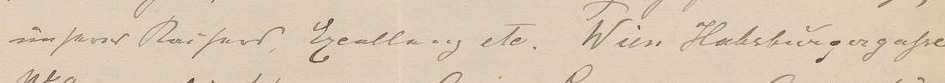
unseres Kaisers, Excellenz etc. Wien Habsburgergasse
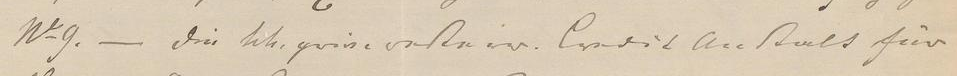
9. – Die kk. ... oesterr. Credit Anstalt für
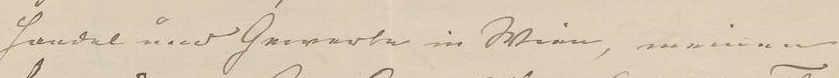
Handel und Gewerbe in Wien, meinen
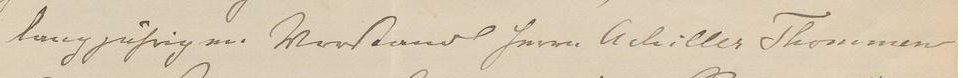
langjährigen. Vorstand Herrn Achilles Thommen
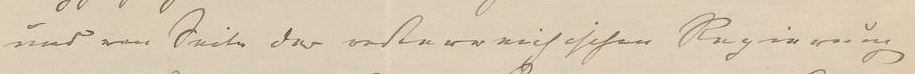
und von Seite der österreichischen Regierung
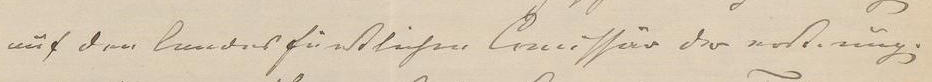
auf den landesfürstlichen Comissair der oest.ung.
